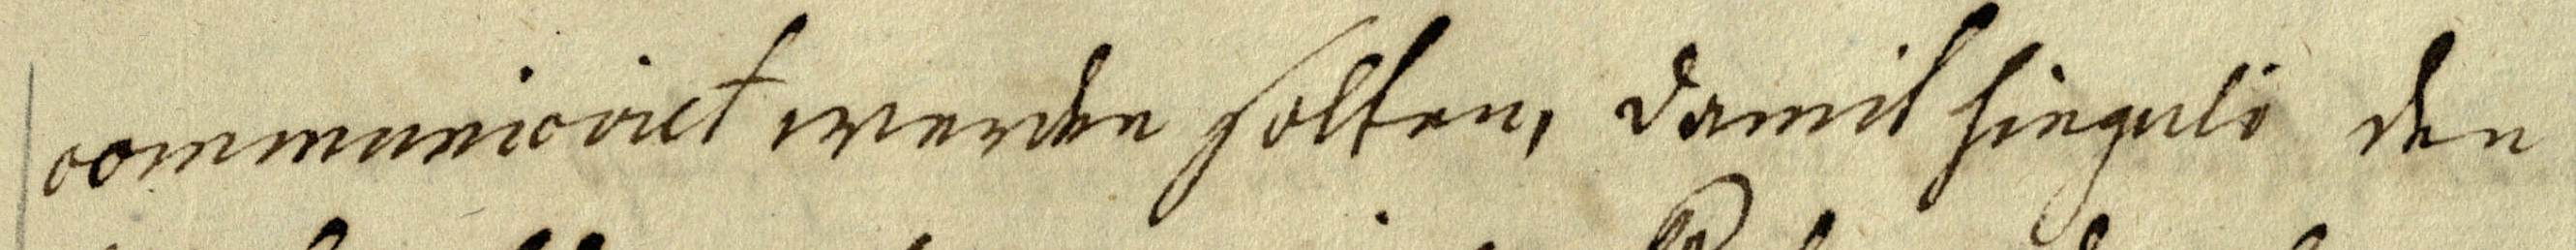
communiciret werden solten, damit singuli den
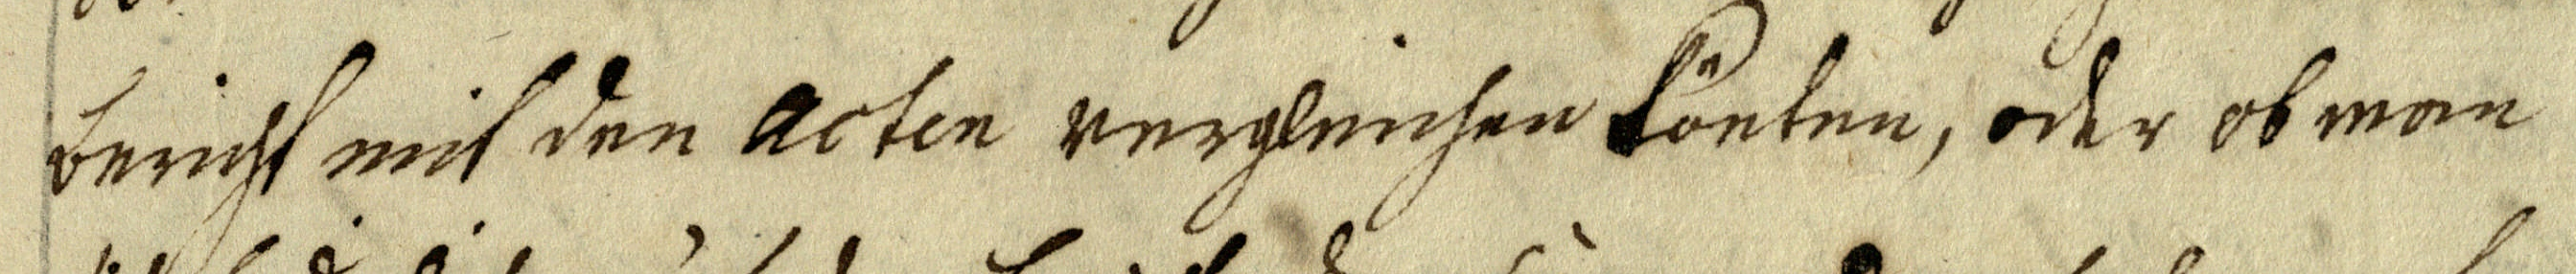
Bericht mit den Acten vergleichen könten, oder ob man
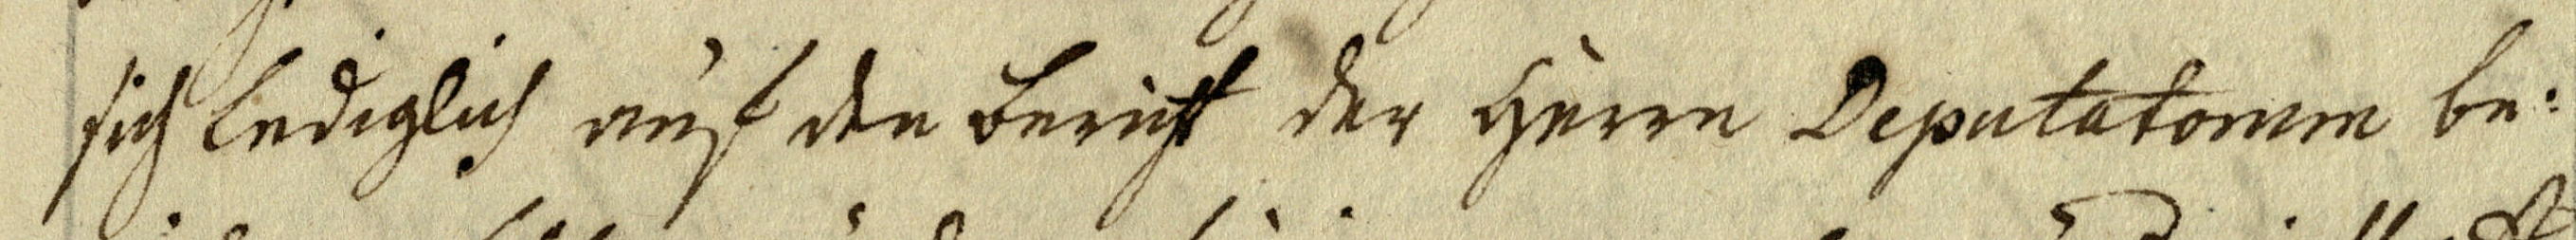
sich lediglich auf den Bericht der Herrn Deputatorum be¬
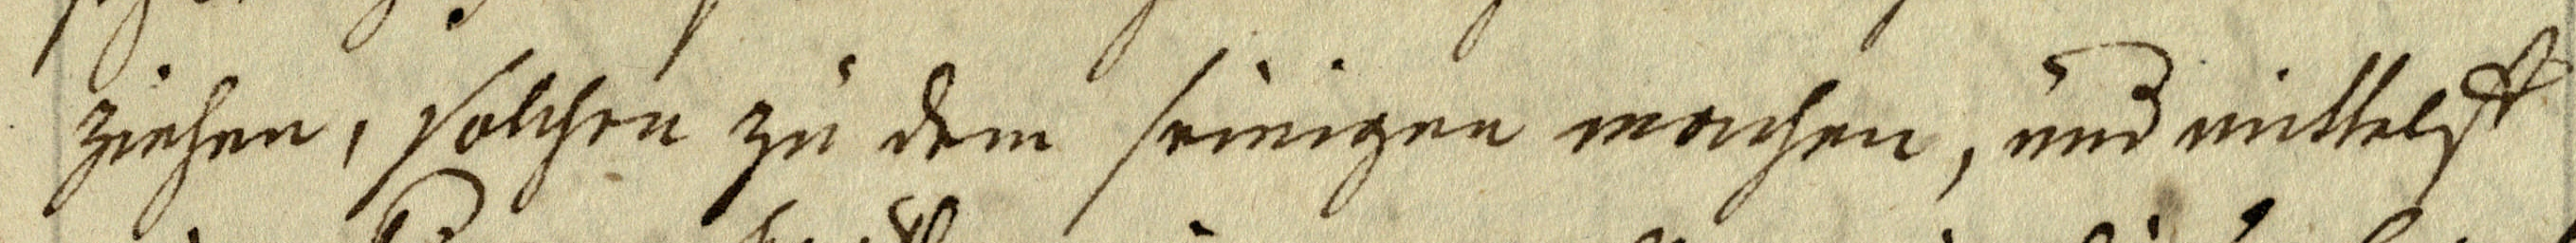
ziehen, solchen zu dem seinigen machen, und mittelst
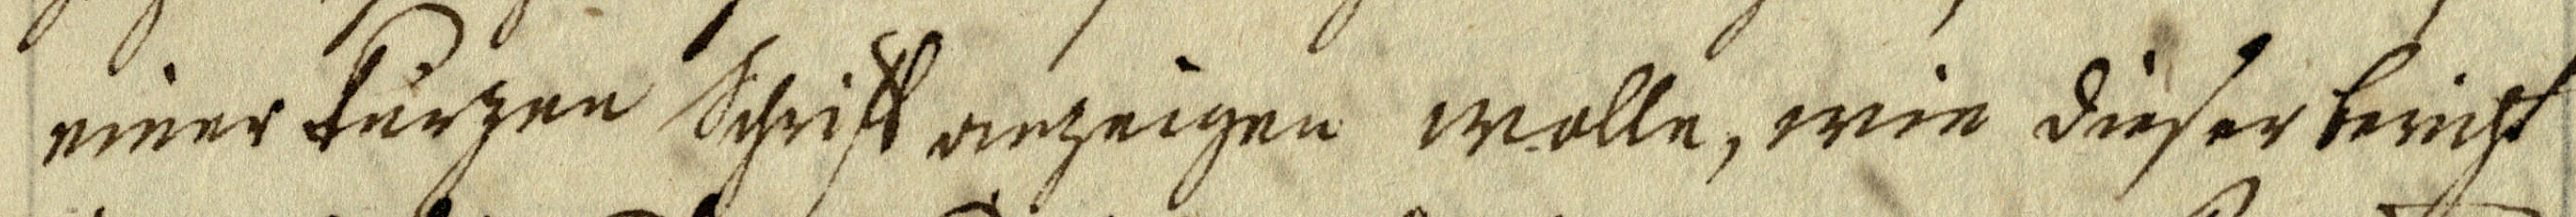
einer kurzen Schrift anzeigen wolle, wie dieser bericht
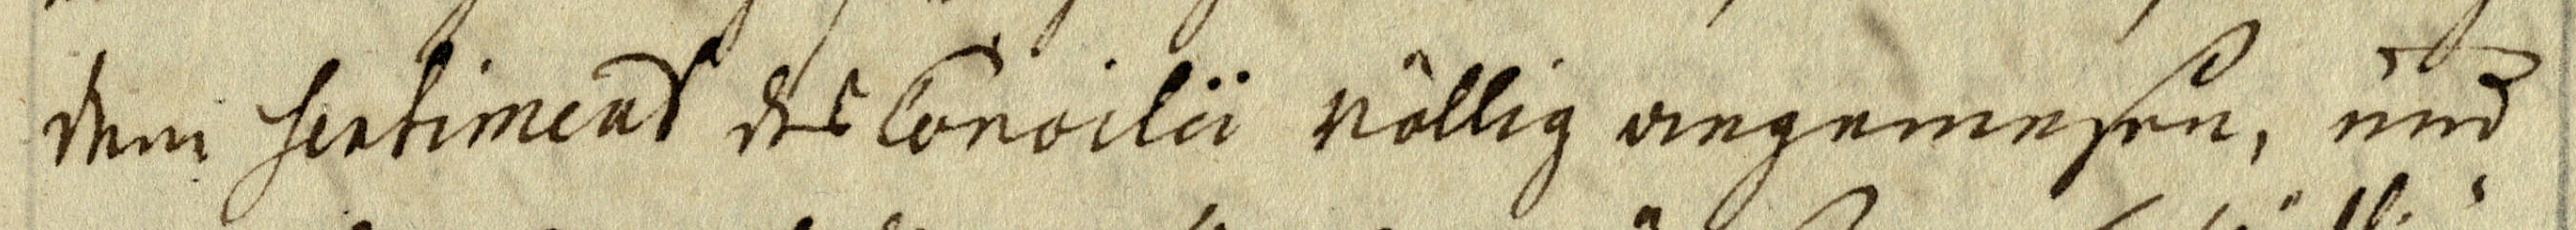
dem sentiment des Concilii völlig angemeßen, und
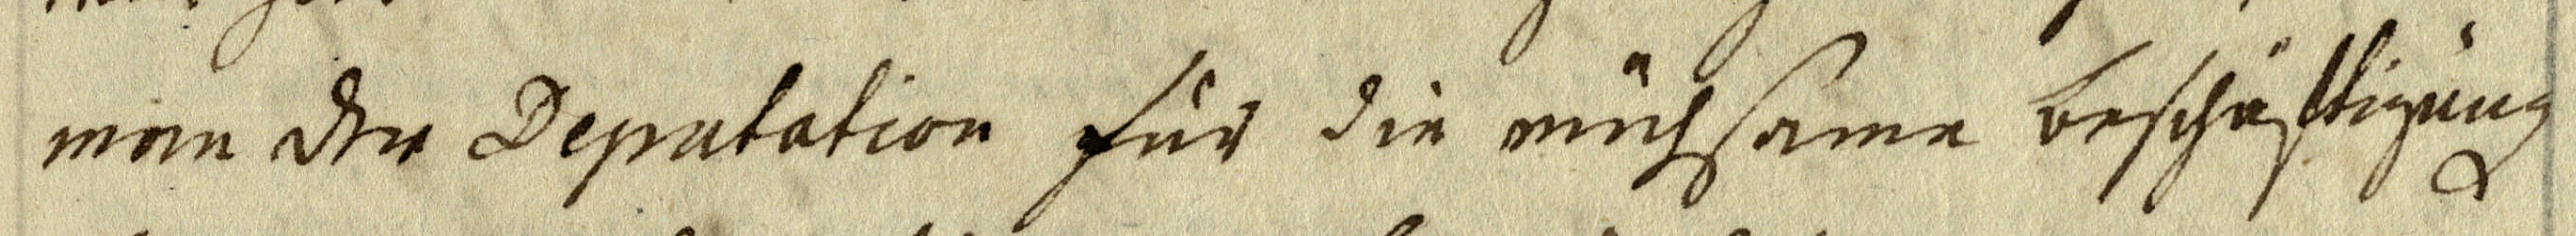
man der Deputation für die mühsame Beschäftigung
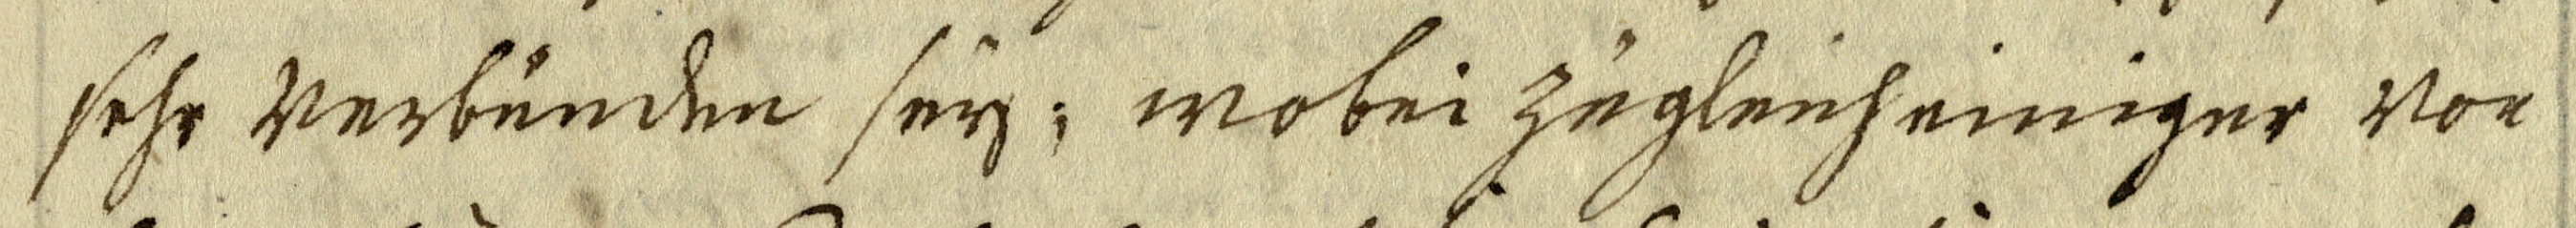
sehr verbunden seÿ, wobei zugleich einiger von
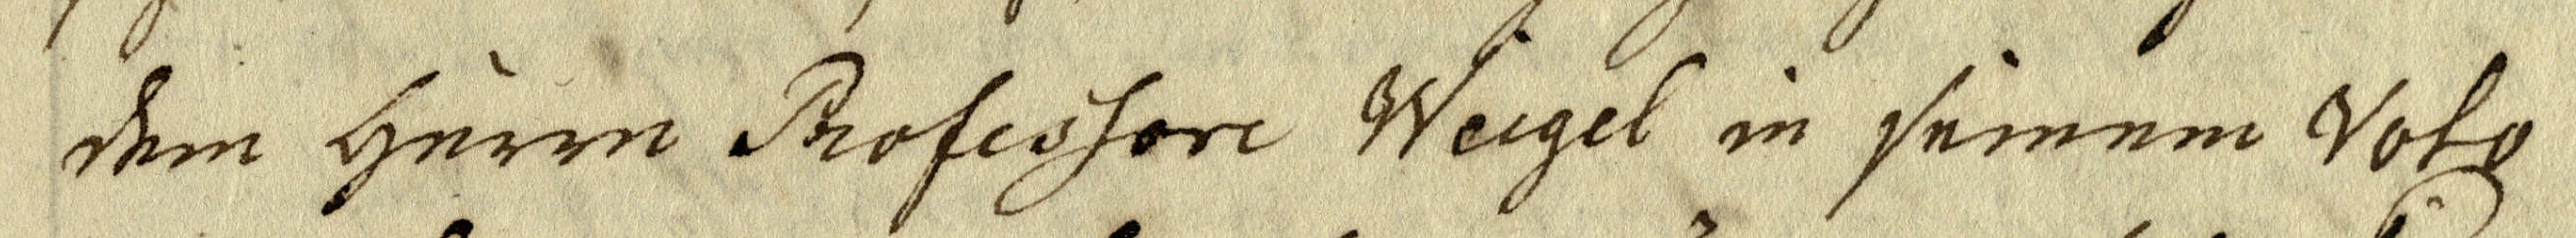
dem Herrn Professor Weigel in seinem Voto
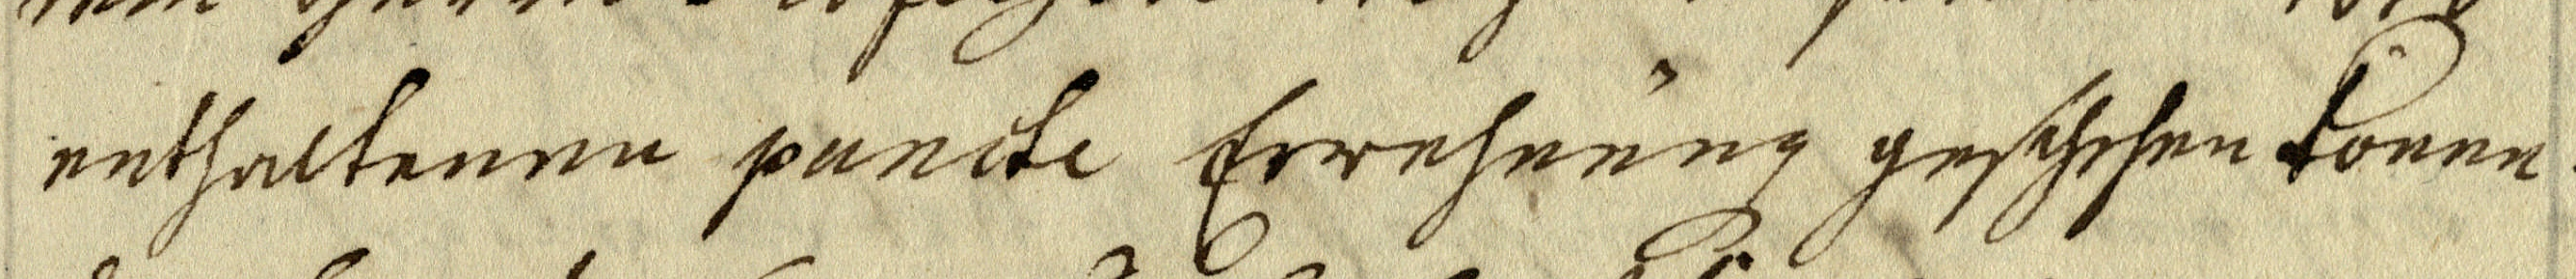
enthaltenen puncte Erwehnung geschehen könne.
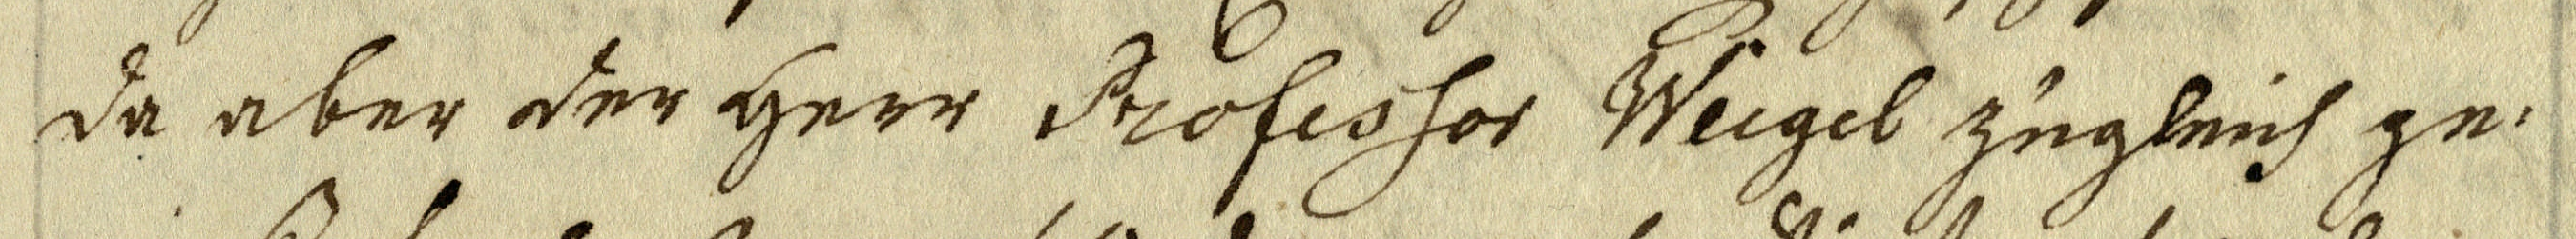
Da aber der Herr Professor Weigel zugleich ge¬
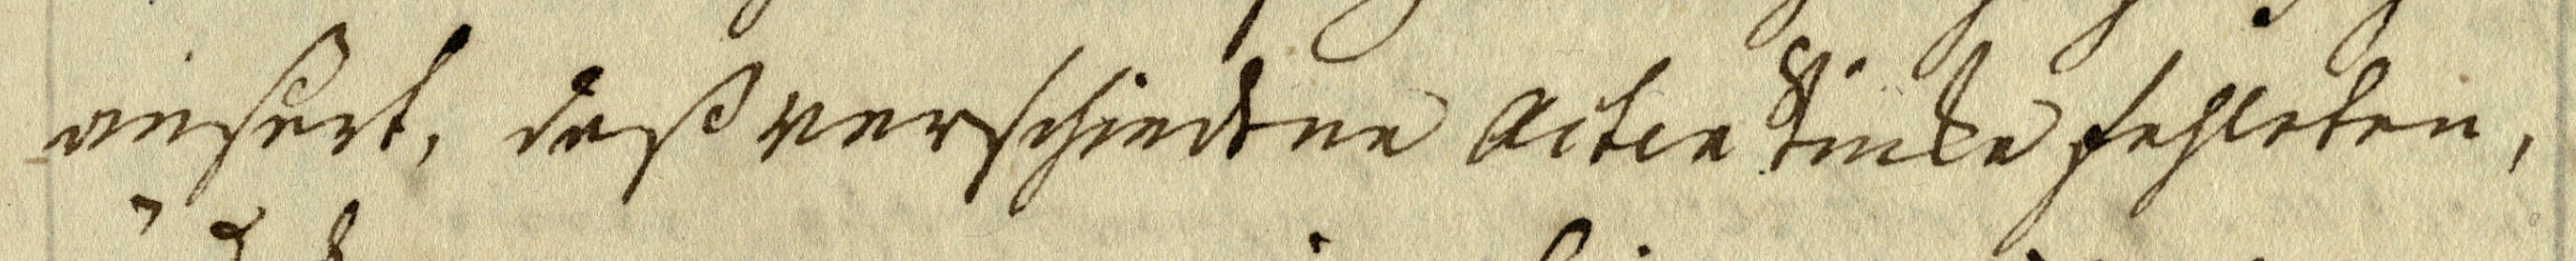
äußert, daß verschiedene Acten Stücke fehleten,
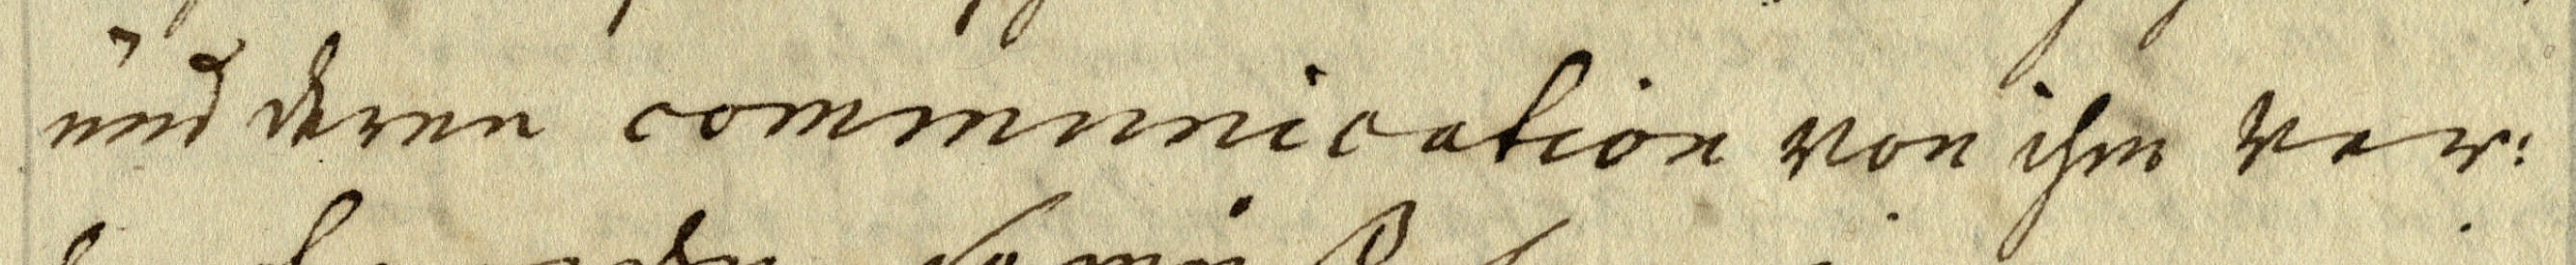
und deren communication von ihm ver¬
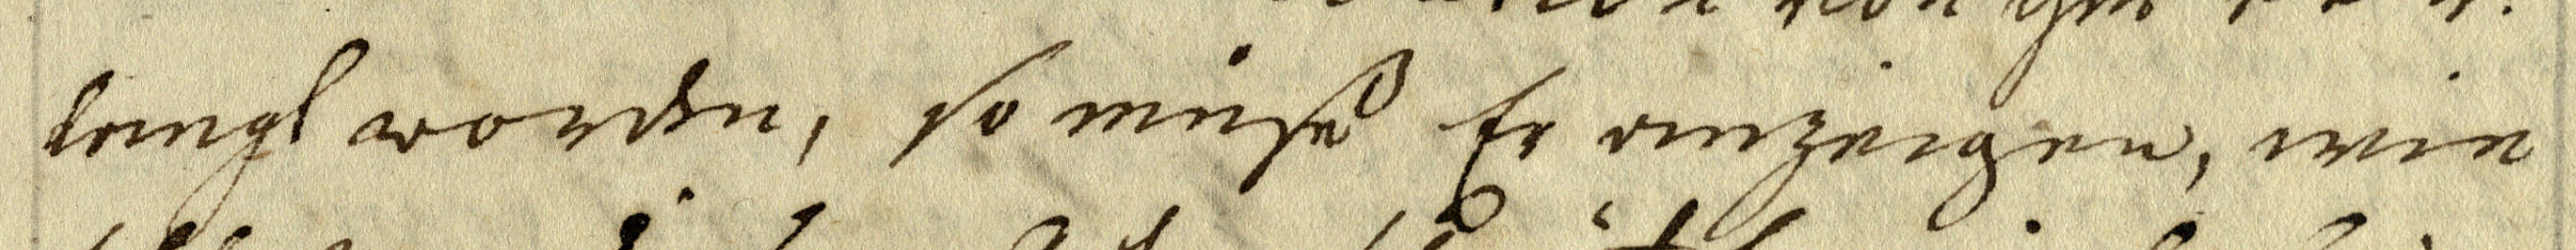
langt worden, so müße Er anzeigen, wie
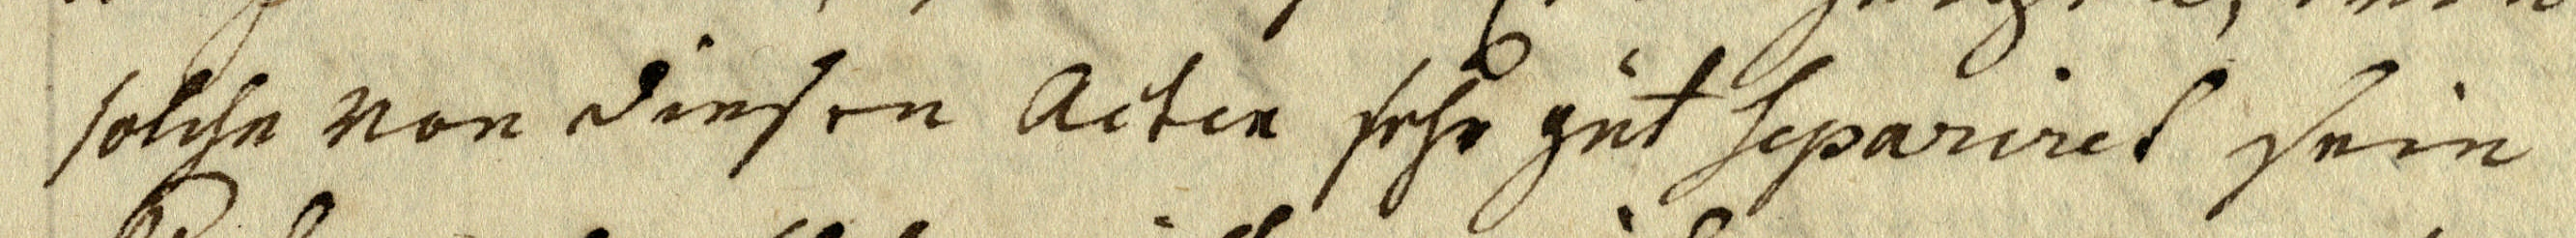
solche von diesen Acten sehr gut separiret sein
